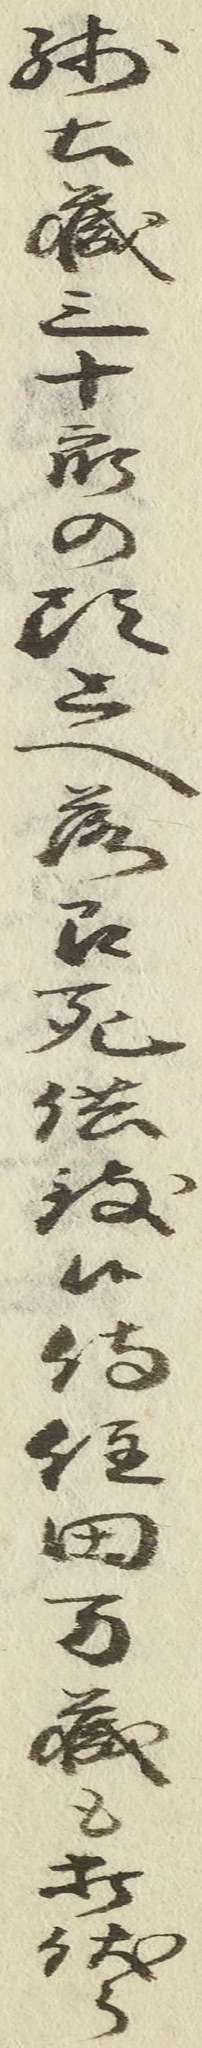残土蔵三十郎の頭上へ落即死供致候侍住田万蔵も打伏ら
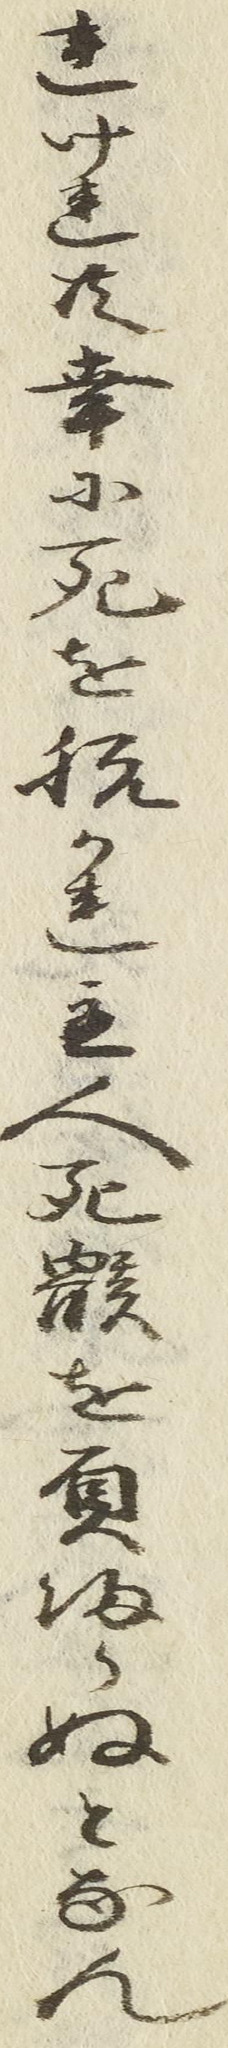れけれ共幸に死を脱かれ主人死骸を負帰りぬとなん
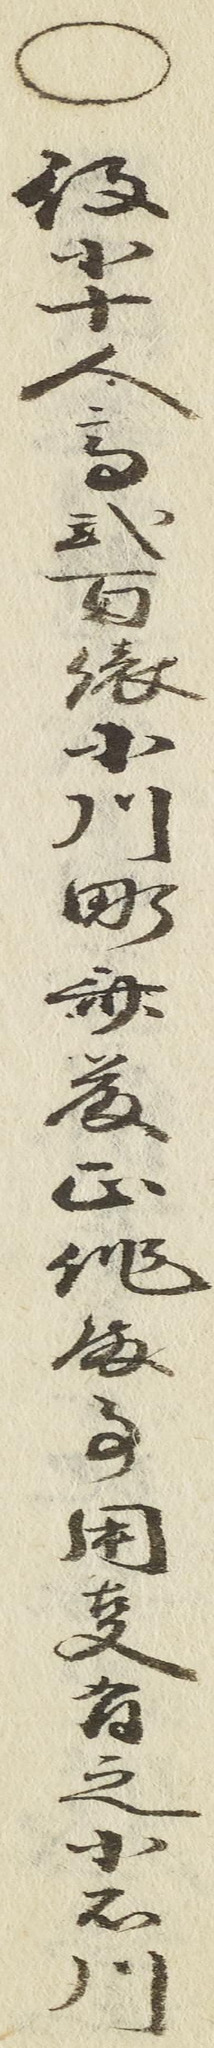○役小十人高弐百俵小川町斎藤正作殿事用事有之小石川
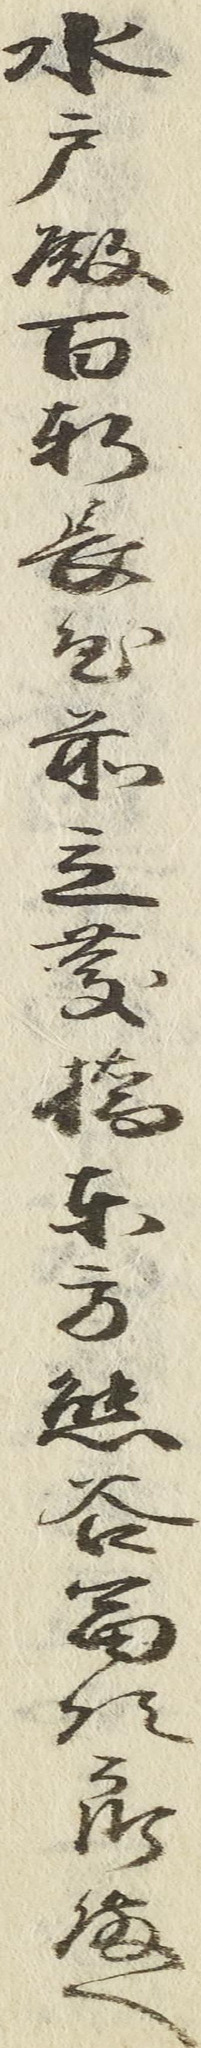水戸殿百軒長屋前立慶橋東方熊谷富次郎殿へ
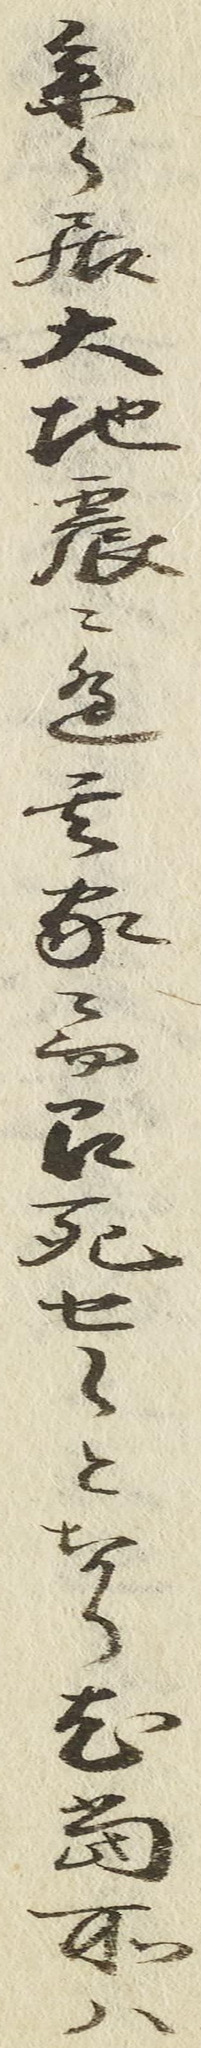参り居大地震ニ逢其家ニ而即死セしとなり尤当所は
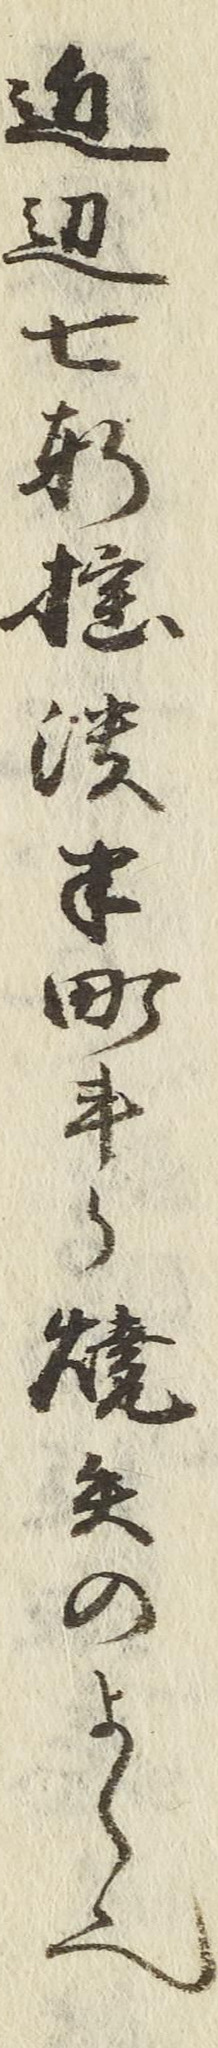近辺七軒揺潰半町計り焼失のよし也
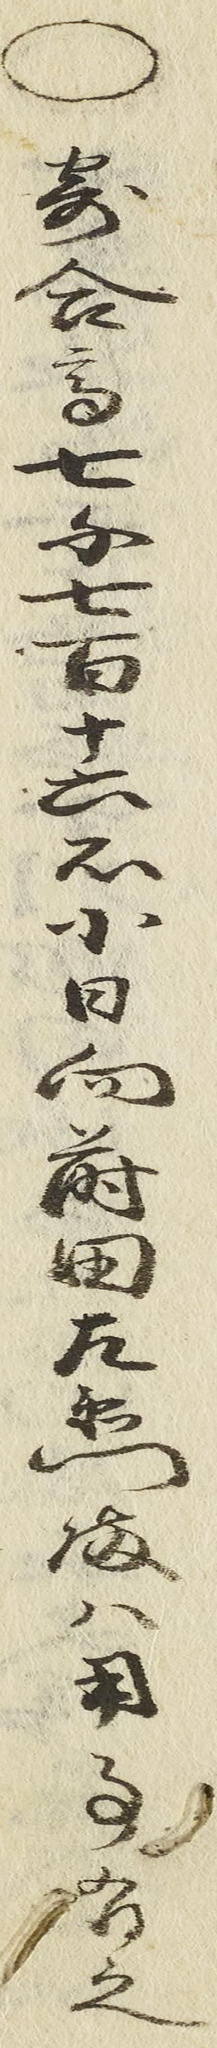○寄合高七千七百十六石小日向蒔田左衛門殿は用事有之
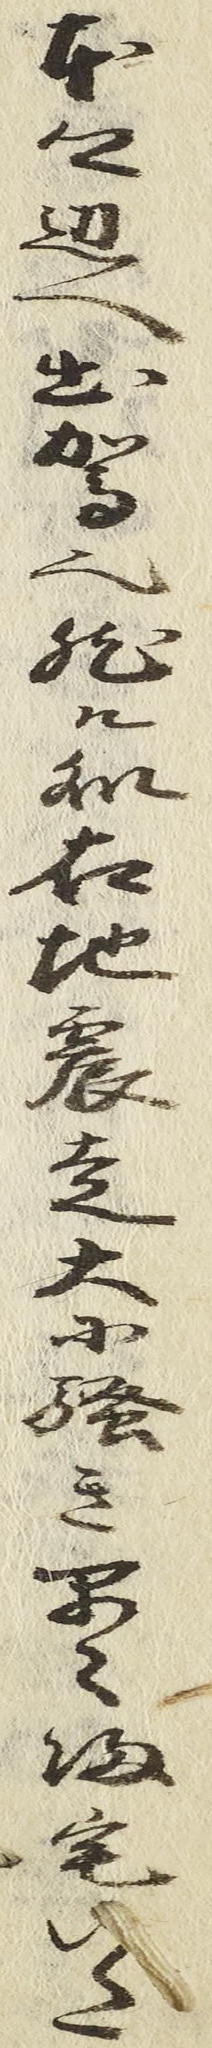本郷辺へ出駕也然ル所右地震走大に騒き早々帰宅いた
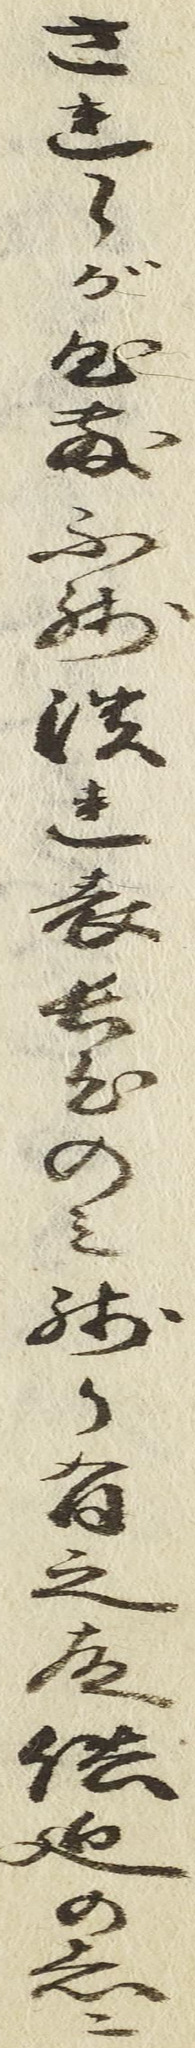されしが屋敷不残潰れ表長屋のみ残り有之故供廻の者ニ
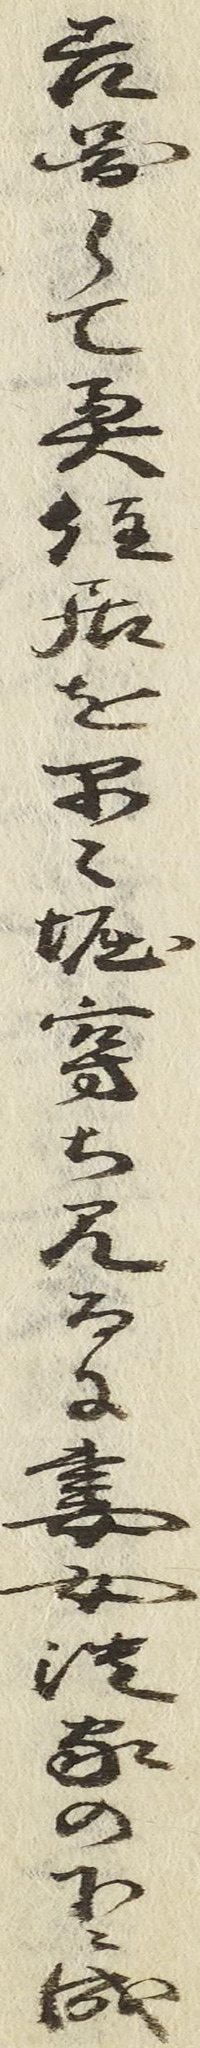差図して奥住居を早々掘穿ち見るに妻女潰家の下ニ成
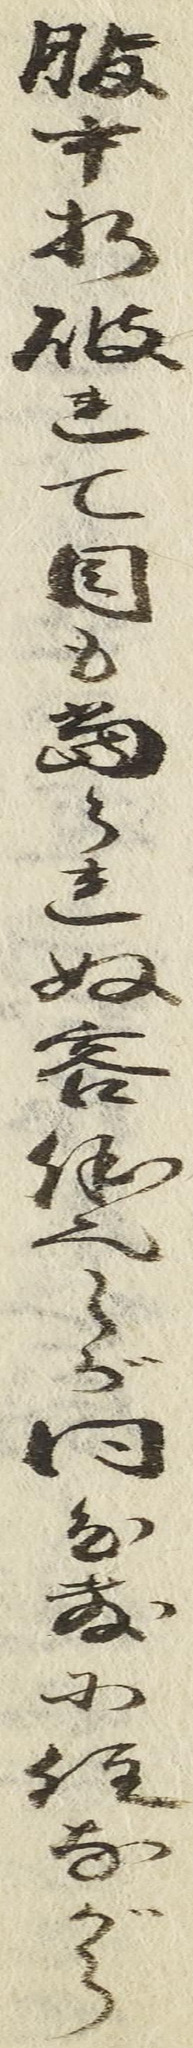腹中折破れて目も当られぬ容体也しが同屋敷に住ながら
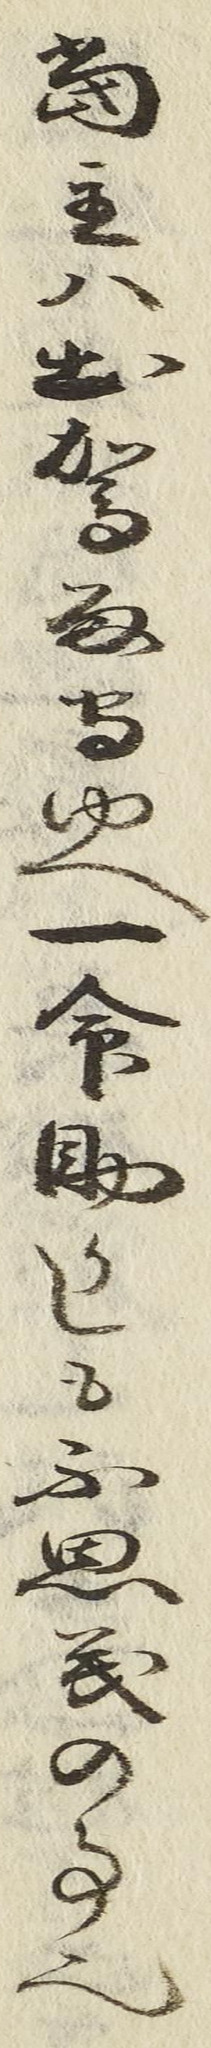当主は出駕留守ゆへ一命助りしも不思義の事也
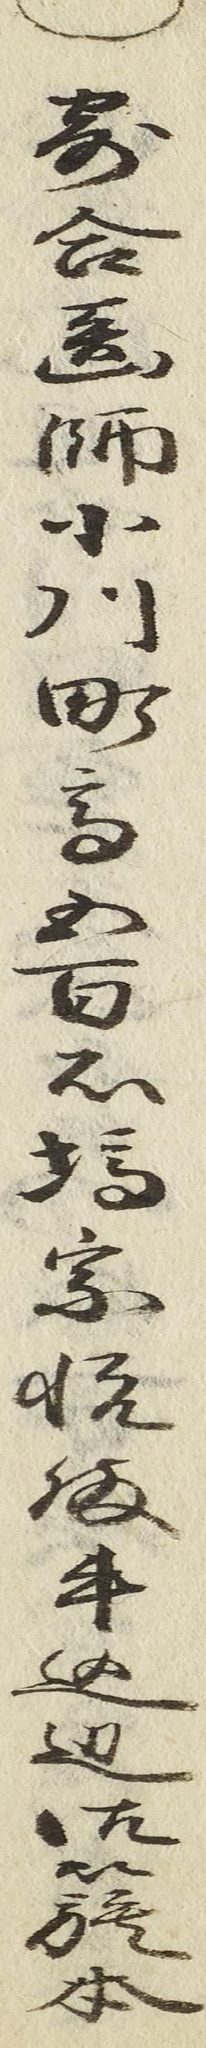○寄合医師小川町高五百石塙宗悦殿牛込辺御籏本
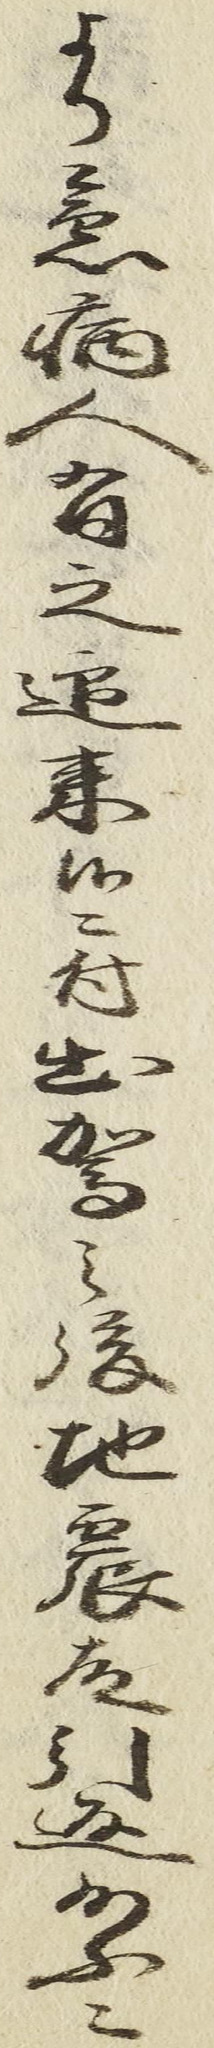より急病人有之迎来候ニ付出駕之後地震故引込給ふニ
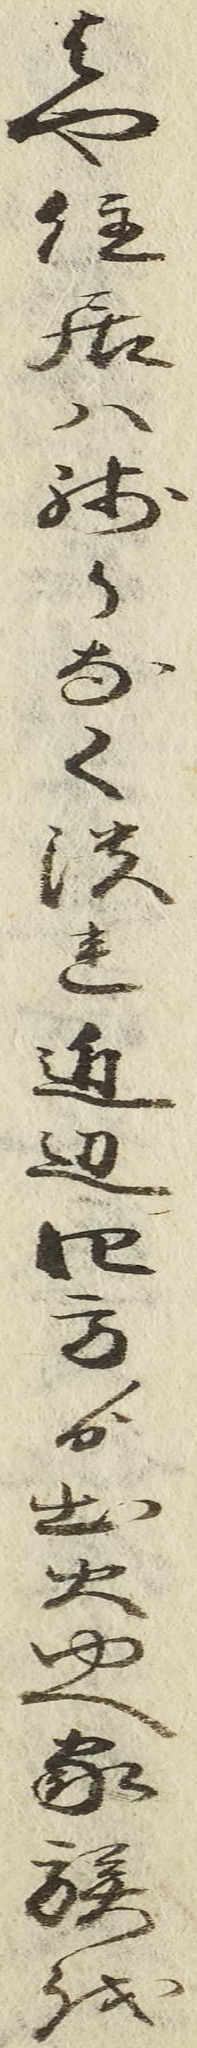はや住居は残りなく潰れ近辺四方ゟ出火ゆへ家族を
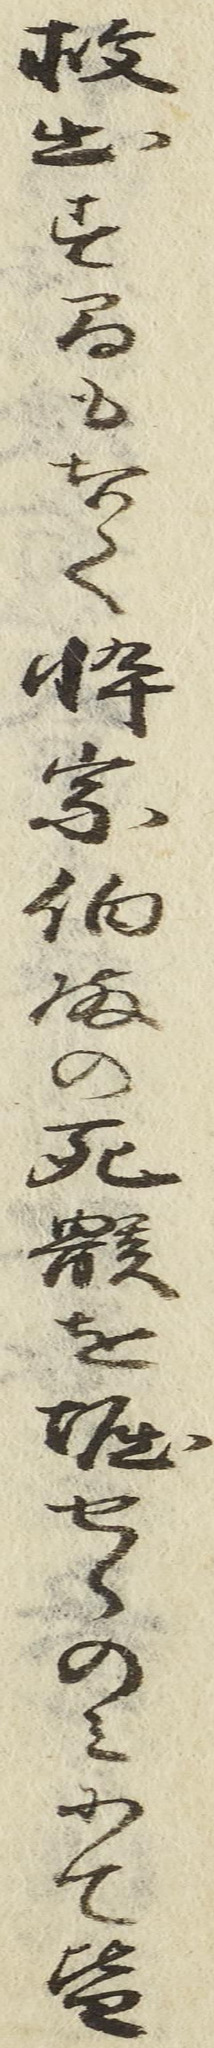救出す間もなく悴宗伯殿の死骸を掘セしのみにて皆
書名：安政二年震災記事　完
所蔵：東京大学地震研究所図書室 Earthquake Research Institute Library, The University of Tokyo, JAPAN
